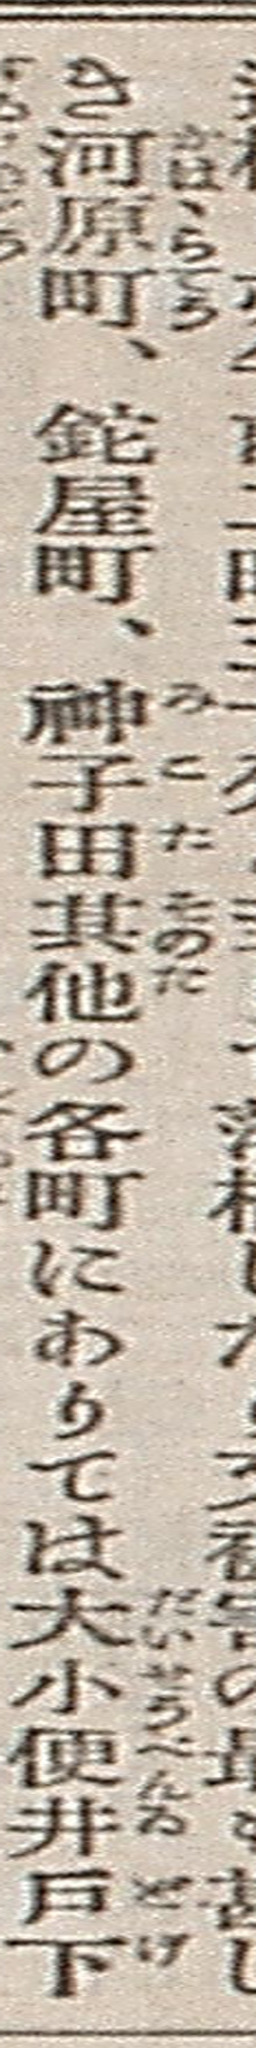き河原町、鉈屋町、神子田其他の各町にありては大小便井戸下
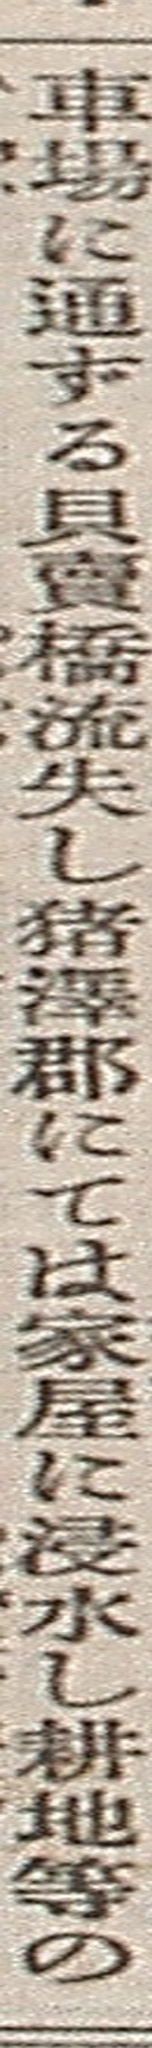車場に通ずる貝売橋流失し猪沢郡にては家屋に浸水し耕地等の
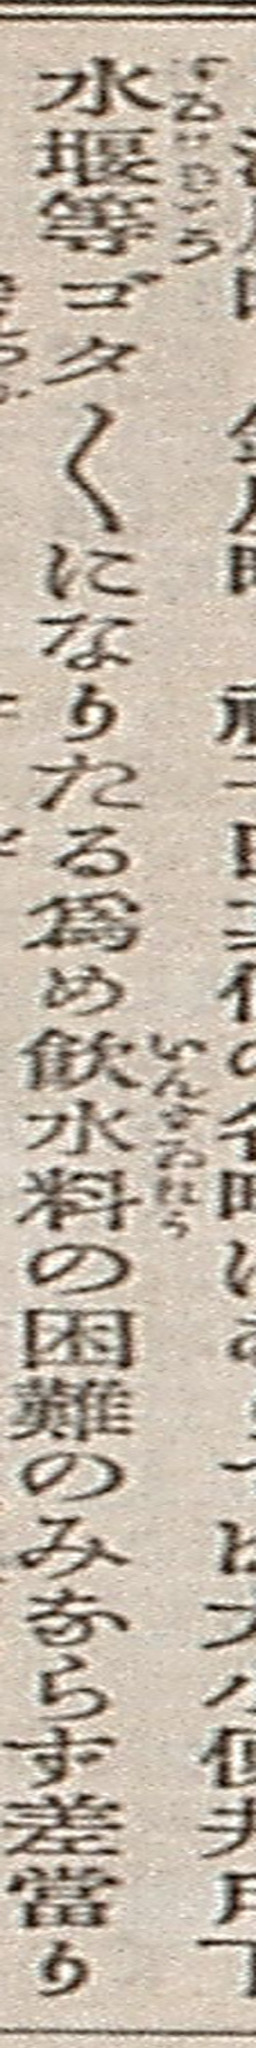水堰等ゴタ〳〵になりたる為め飲水料の困難のみならず差当り
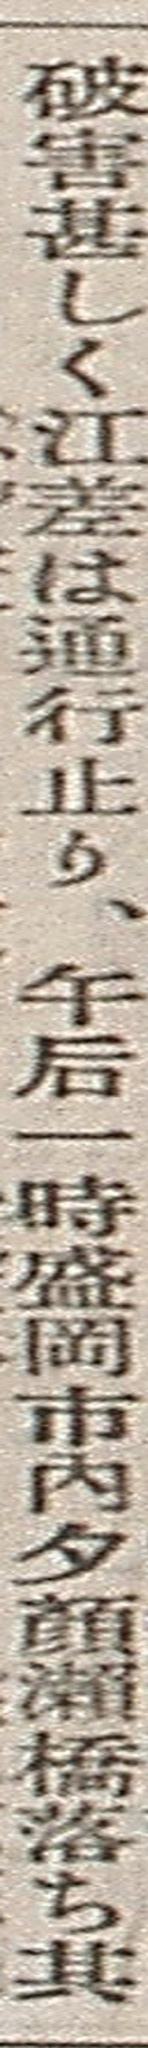被害甚しく江差は通行止り、午後一時盛岡市内夕顔瀬橋落ち其
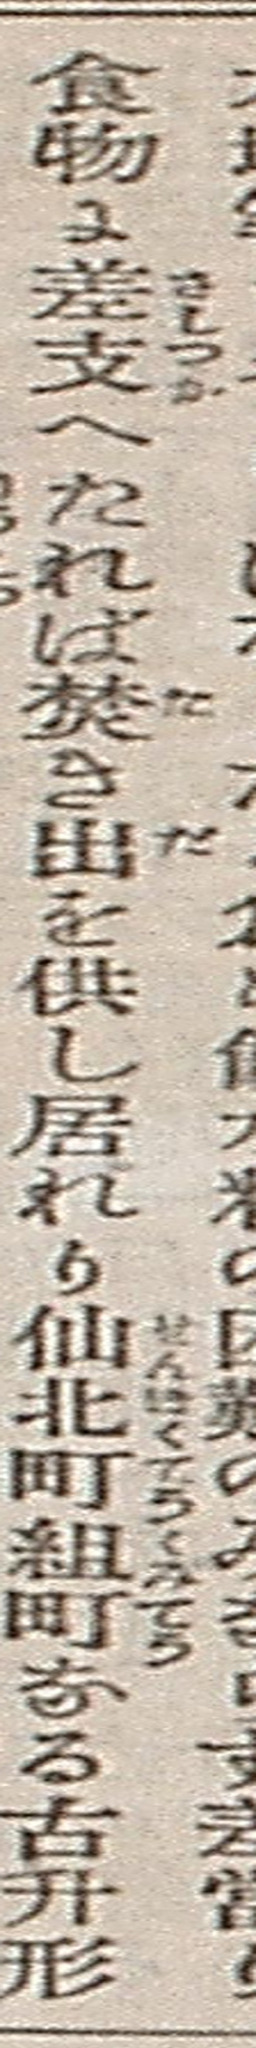食物に差支へたれば焚き出を供し居れり仙北町組町なる古枡形
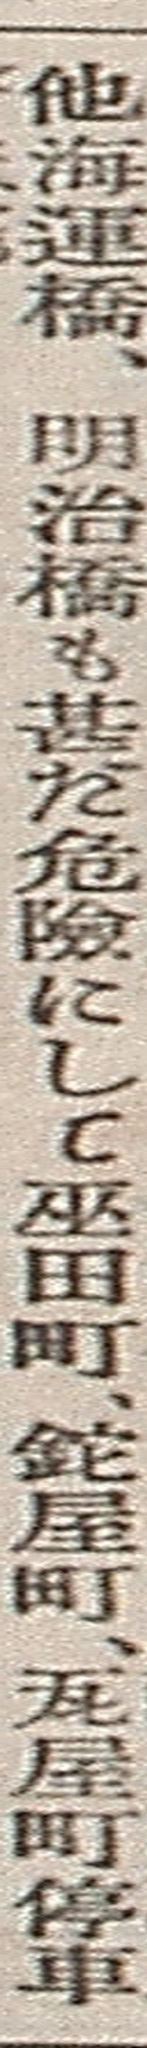他海運橋、明治橋も甚だ危険にして巫田町、鉈屋町、瓦屋町停車
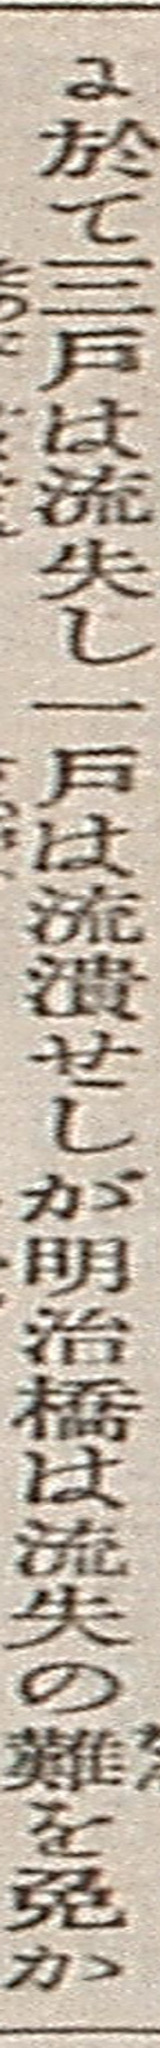に於て三戸は流失し一戸は流潰せしが明治橋は流失の難を免か
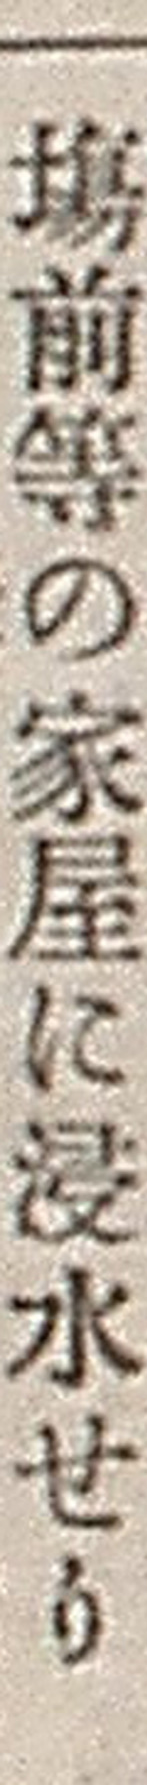場前等の家屋に浸水せり
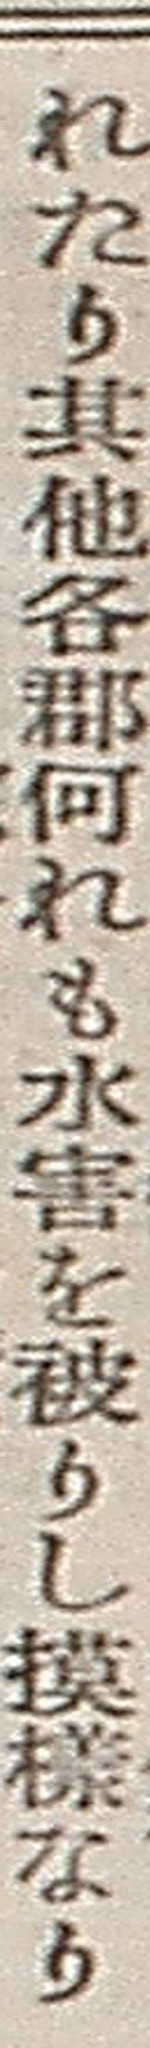れたり其他各郡何れも水害を被りし模様なり
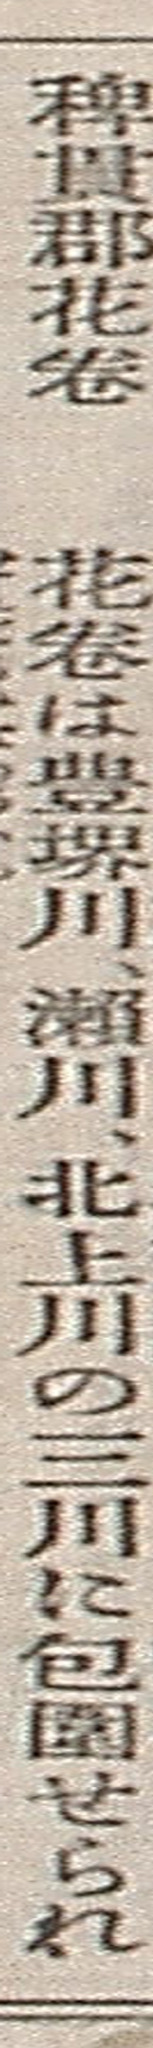稗貫郡花巻花巻は豊堺川、瀬川、北上川の三川に包囲せられ
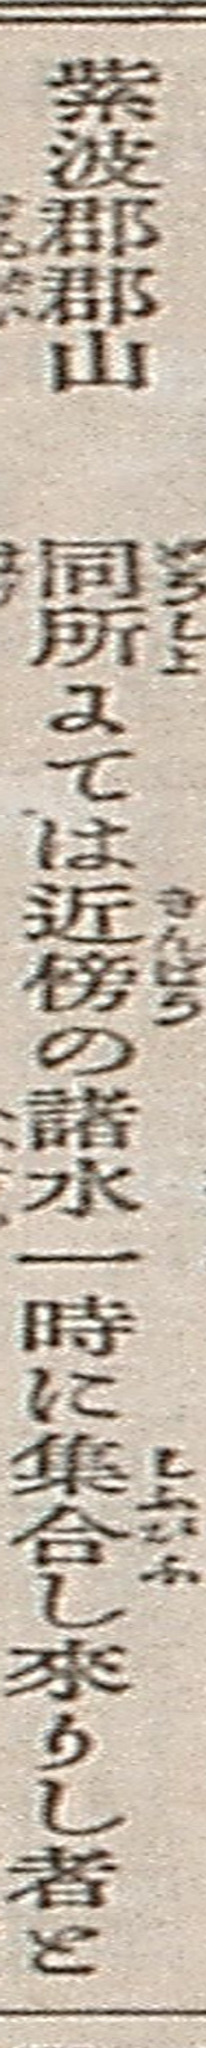紫波郡郡山同所にては近傍の諸水一時に集合し来りし者と
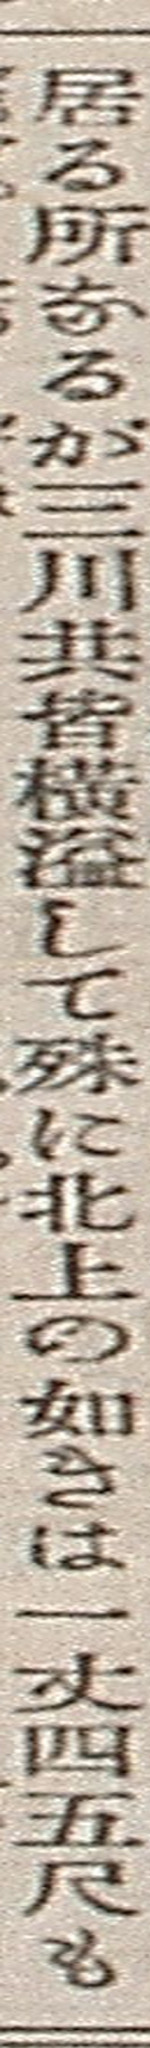居る所なるが三川共皆横溢して殊に北上の如きは一丈四五尺も
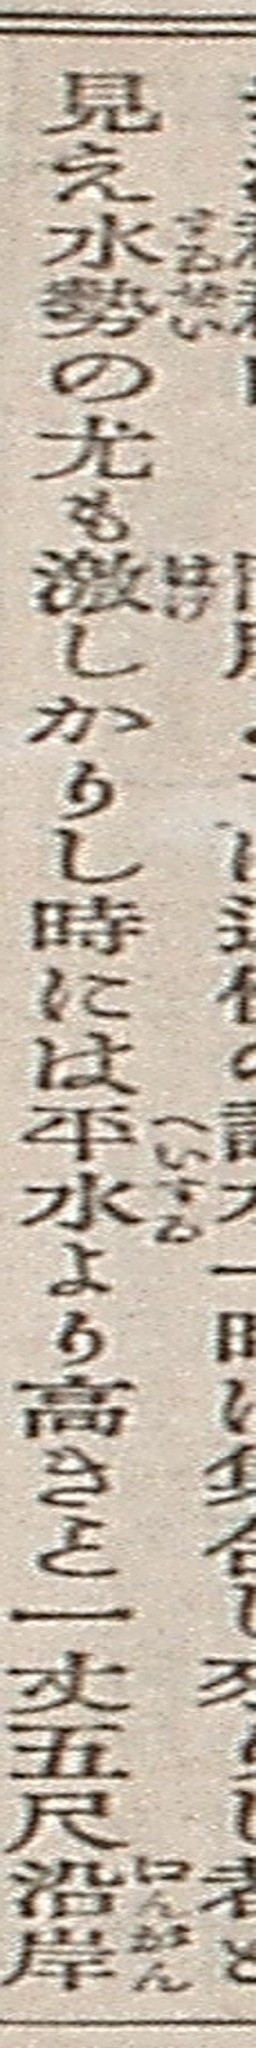見え水勢の尤も激しかりし時には平水より高きこと一丈五尺沿岸
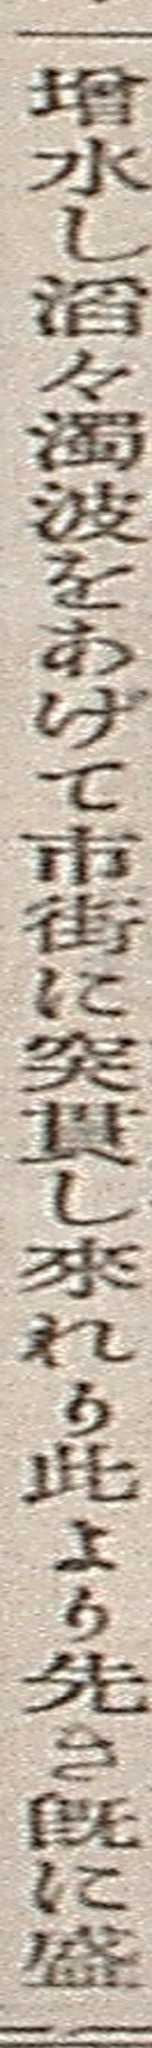増水し滔々濁波をあげて市街に突貫し来れり此より先き既に盛

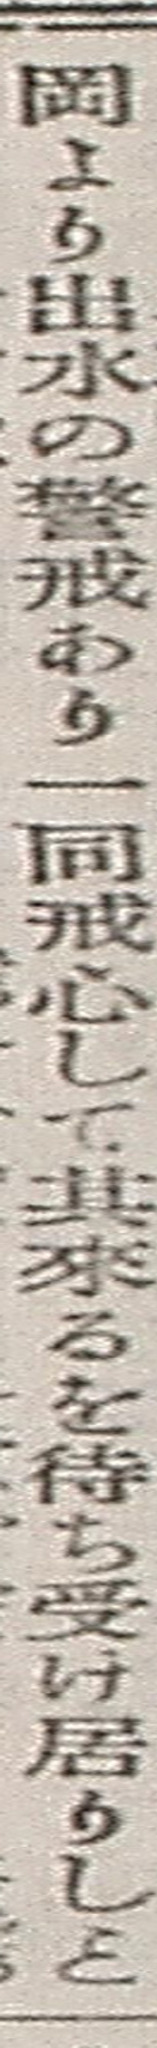岡より出水の警戒あり一同戒心して其来るを待ち受け居りしこと
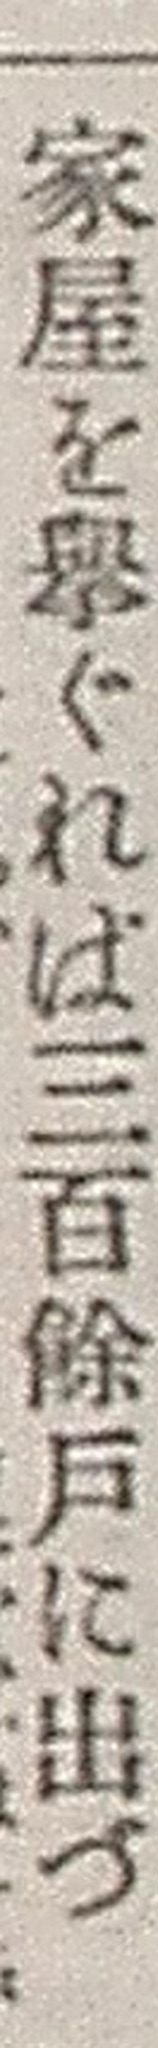家屋を挙ぐれば三百餘戸に出づ
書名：風俗畫報臨時増刊第百二十八號　洪水被害録（下）
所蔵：東京大学地震研究所図書室 Earthquake Research Institute Library, The University of Tokyo, JAPAN
